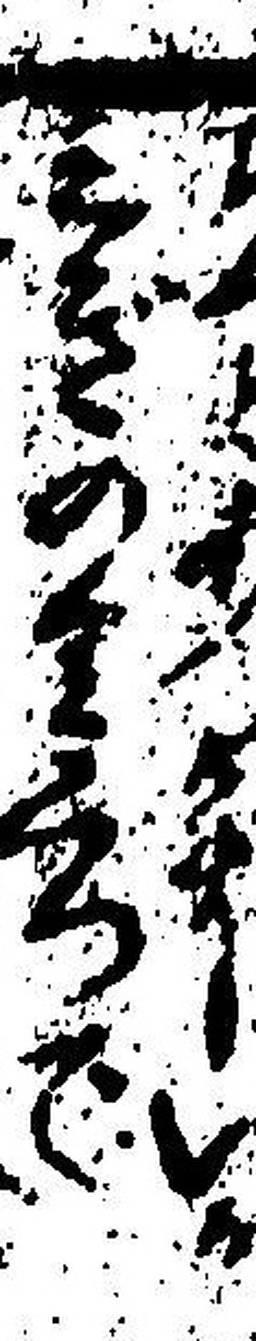みぎのりくつで
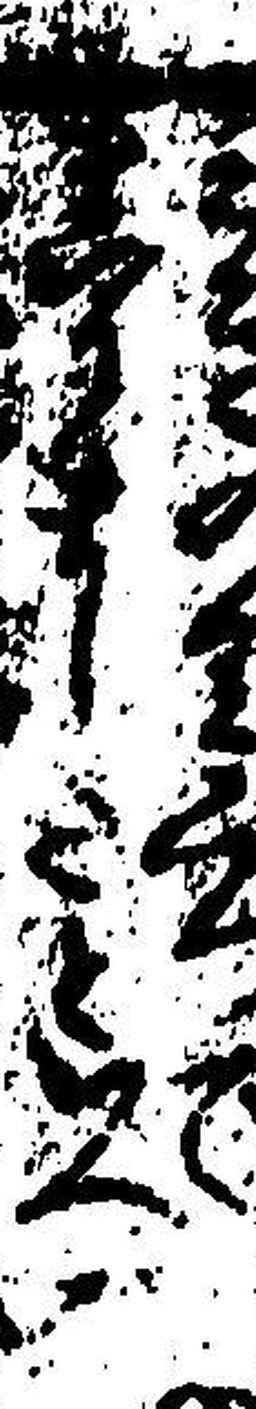まいりましたといへは
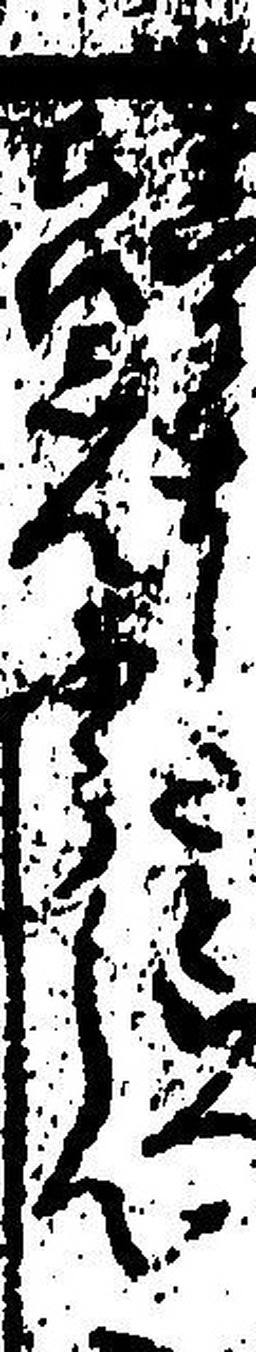らいしんふうしん
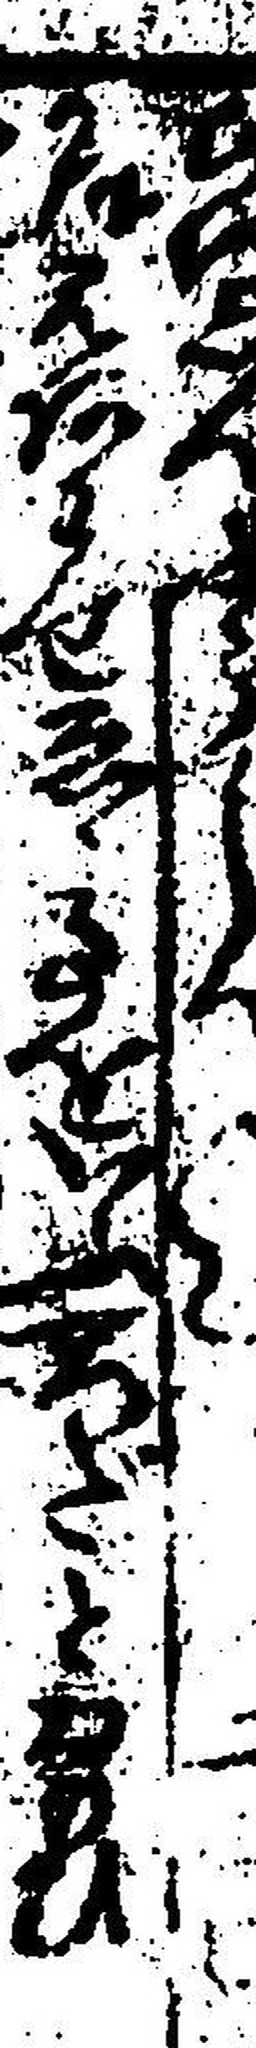かほみあわせゑゝ事をいふやつだとおもひ
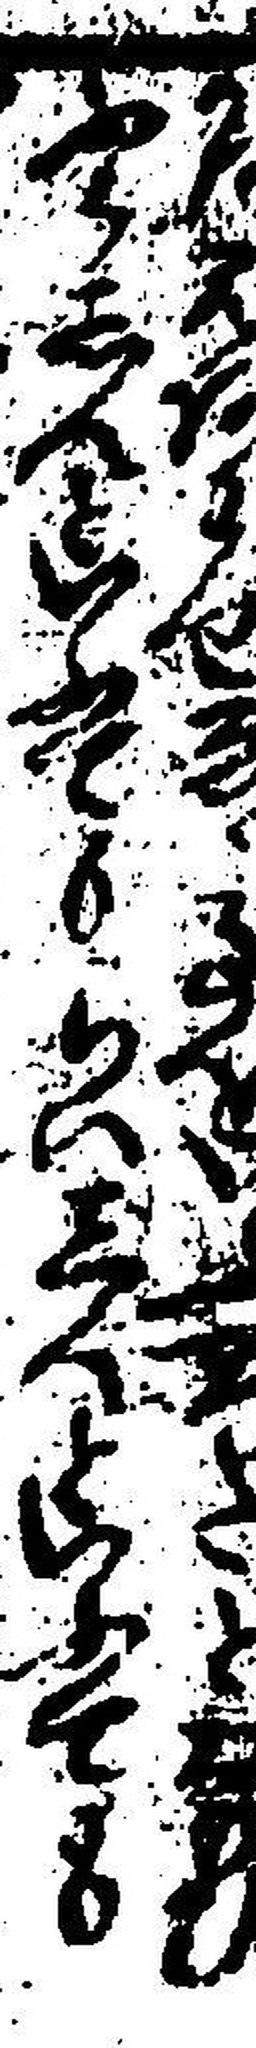ふうしんといふてもらいじんといふても
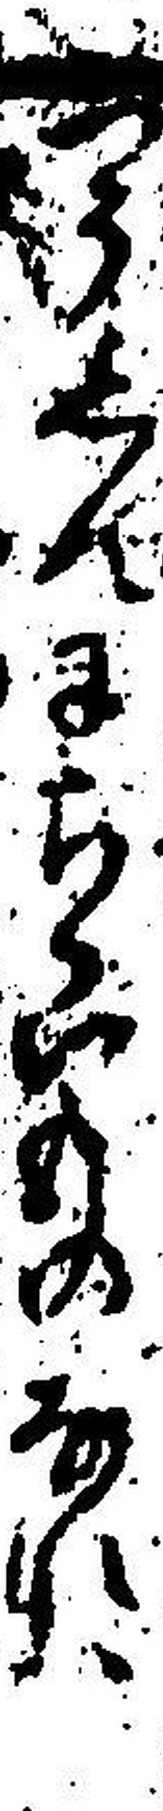つうしんにちかいものなれは
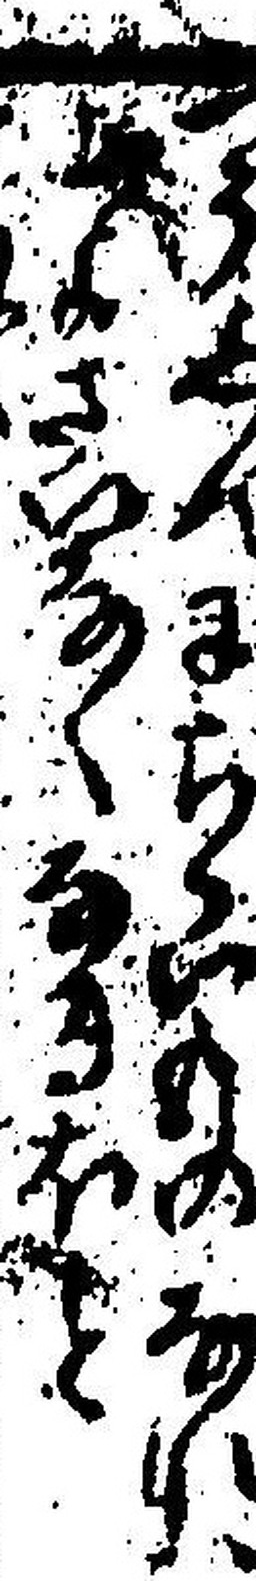しよさいなくなるほと
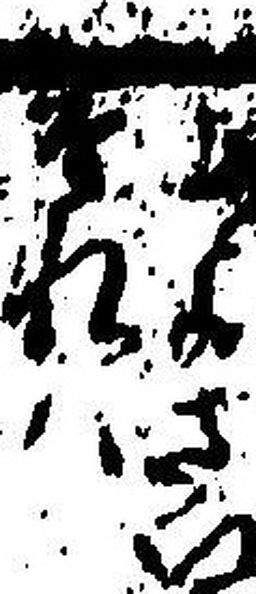それは
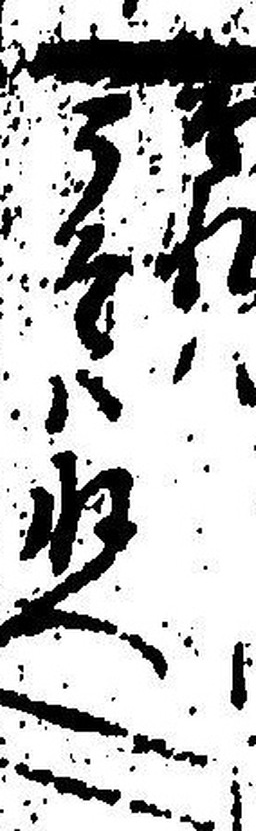うそはねへ
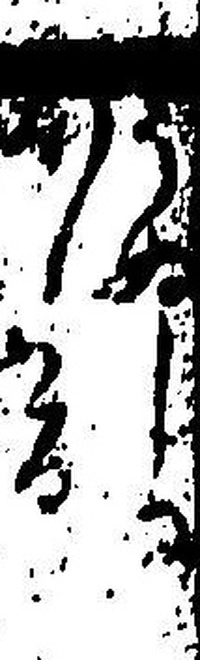ほしかる
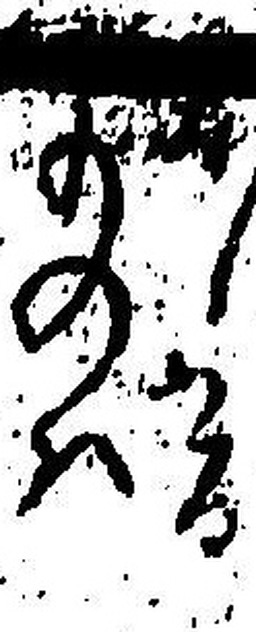ものは
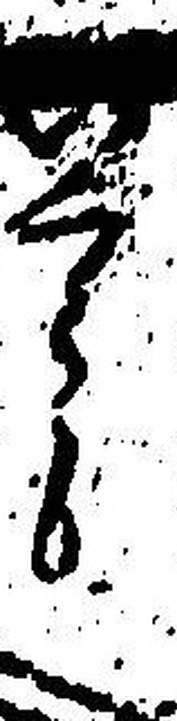いくらも
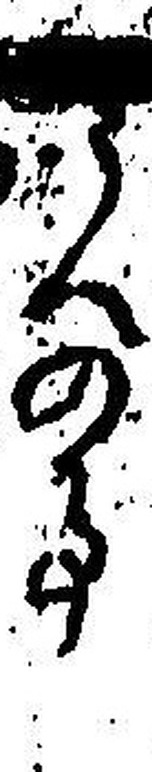うんの事
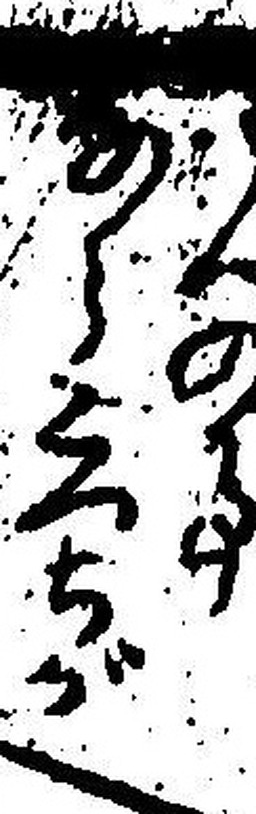ならこつちが
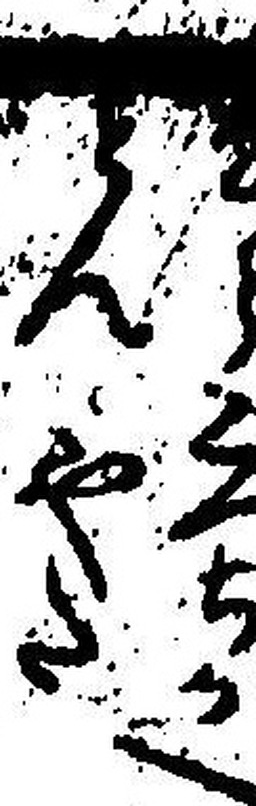とんやさ
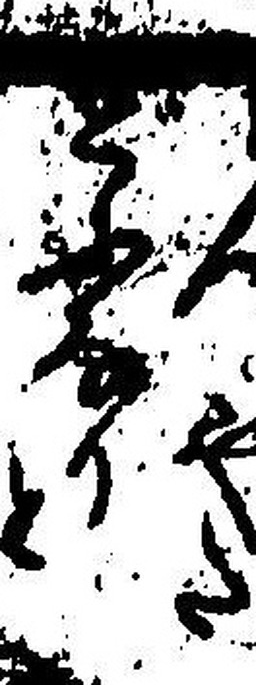とふなりと
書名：牡丹餅棚有 / 市場通笑作
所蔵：東京大学総合図書館 General Library in the University of Tokyo, JAPAN
